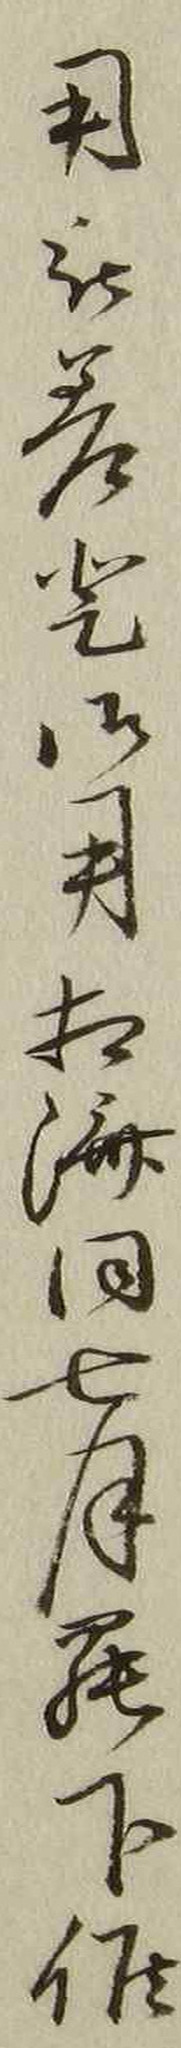用被差登御用相済同七月罷下候
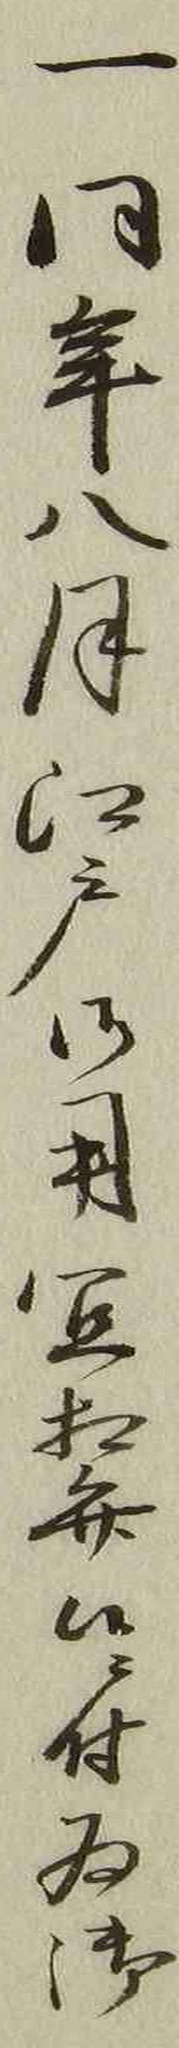一同年八月江戸御用宜相弁候ニ付為御
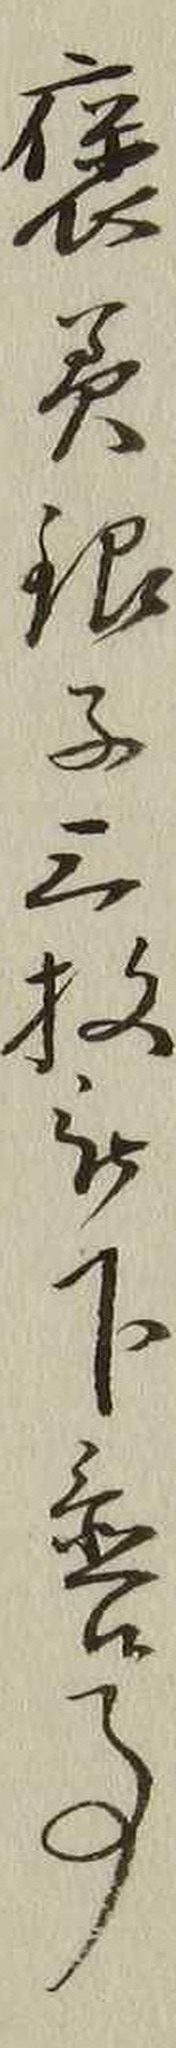褒美銀子三枚被下置候事
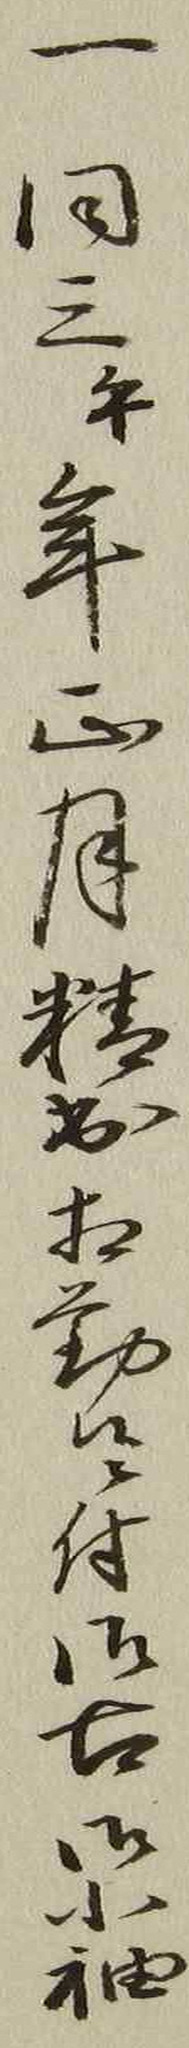一同三午年正月精出相勤候ニ付御古御小袖
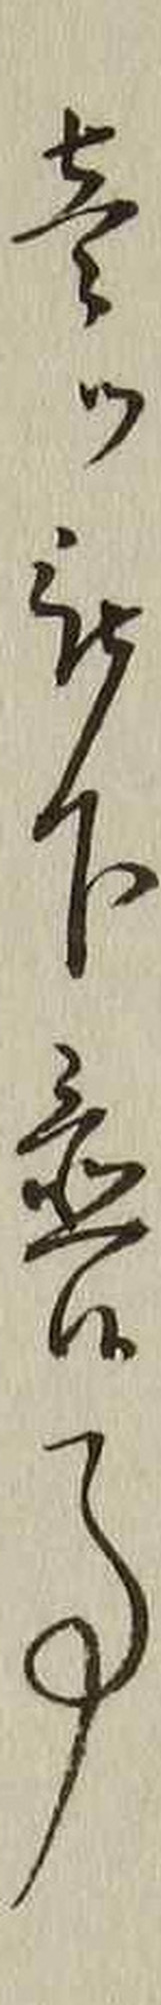壱ツ被下置候事
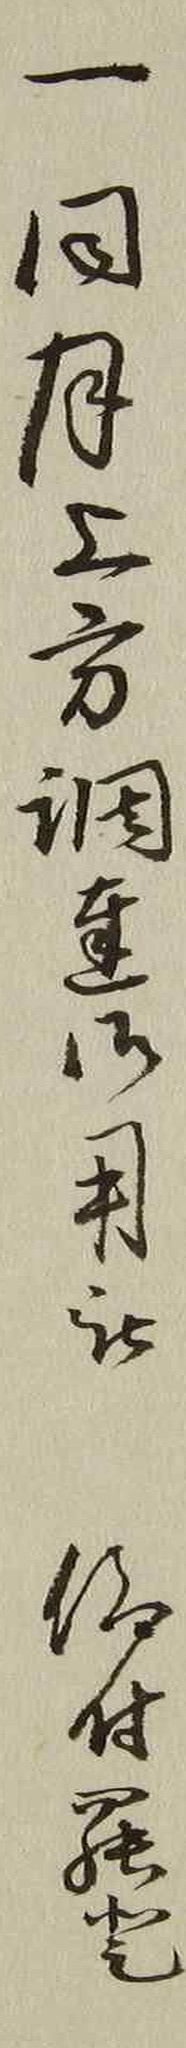一同月上方調達御用被仰付罷登
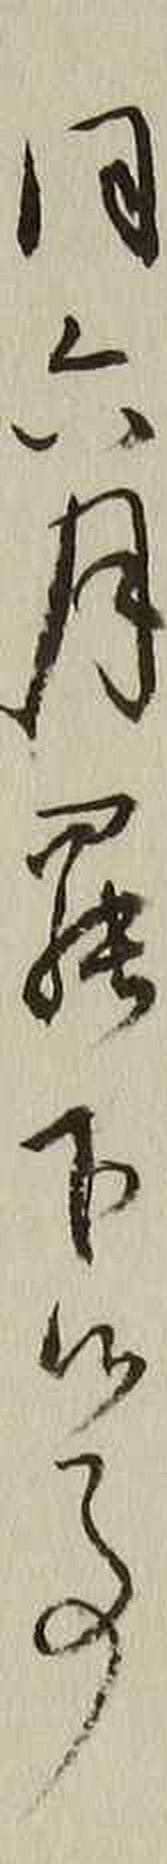同六月罷下候事
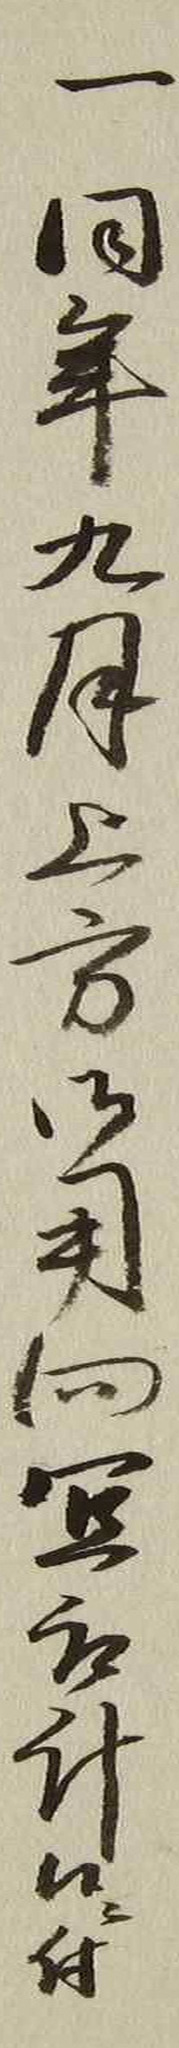一同年九月上方御用向宜取計候ニ付
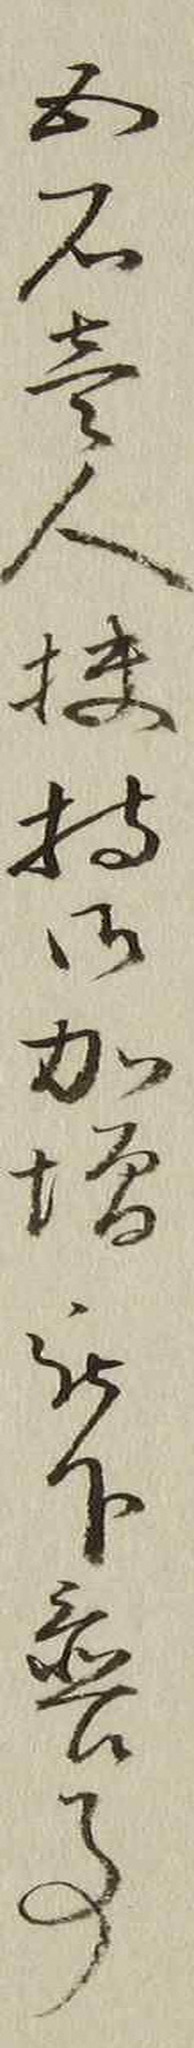五石壱人扶持御加増被下置候事
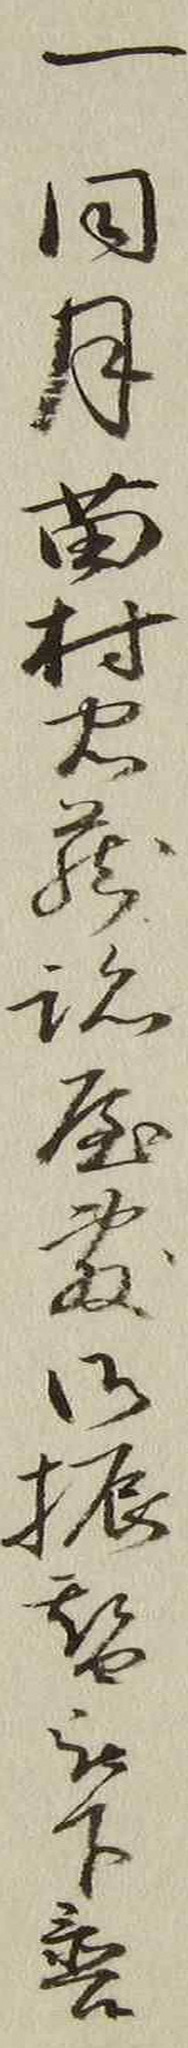一同月苗村忠蔵跡屋敷御振替被下置候
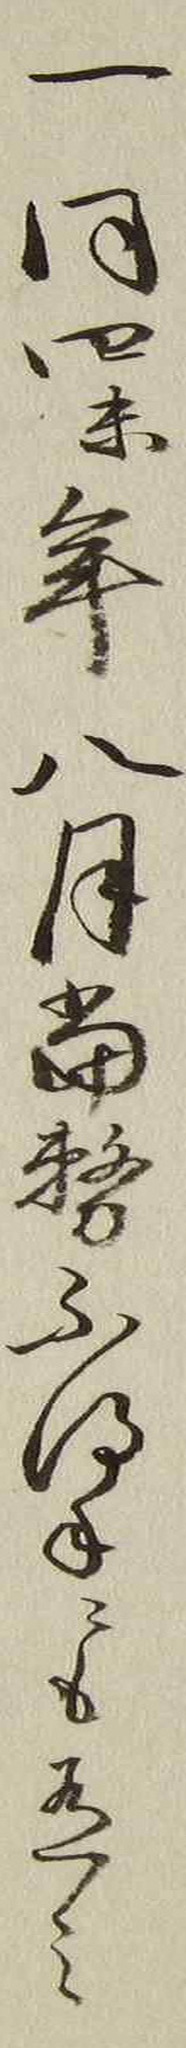一同四未年八月当務ふ得手ニも有之
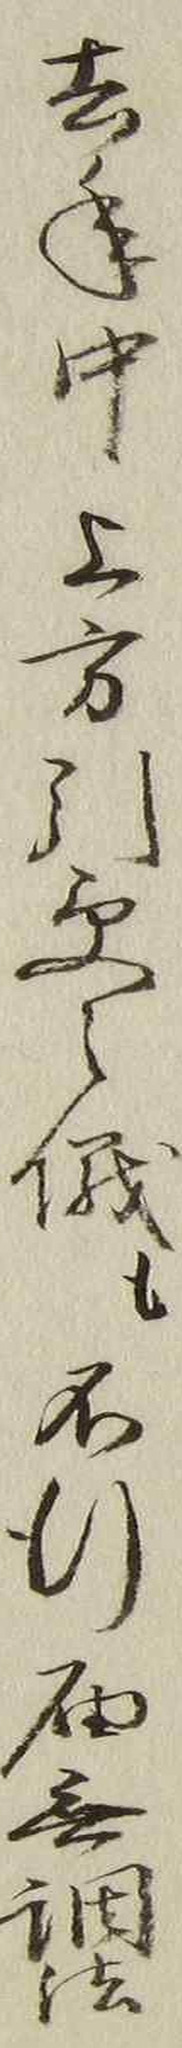去年中上方引受之儀も不行届無調法
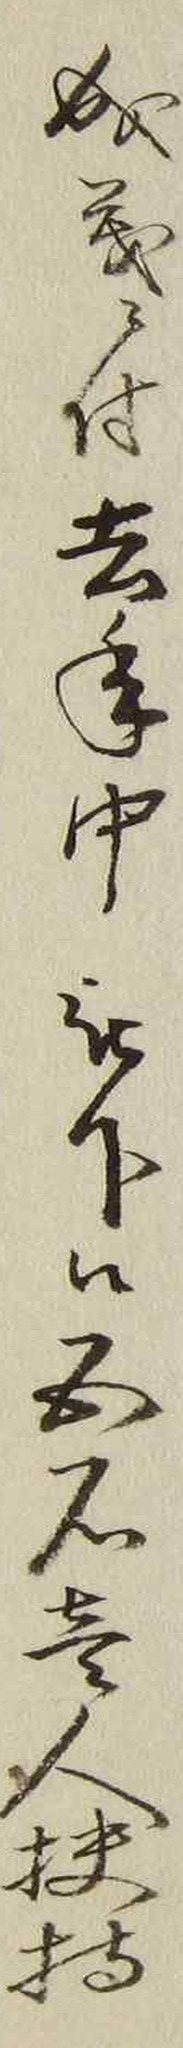成義ニ付去年中被下候五石壱人扶持
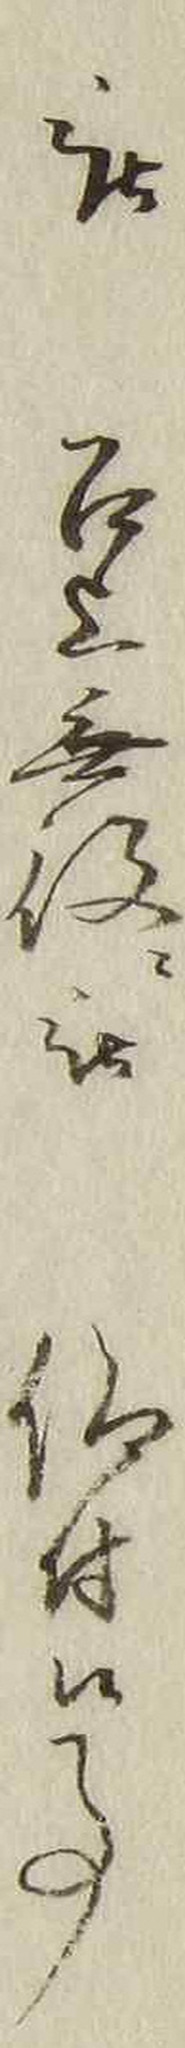被召上無役ニ被仰付候事
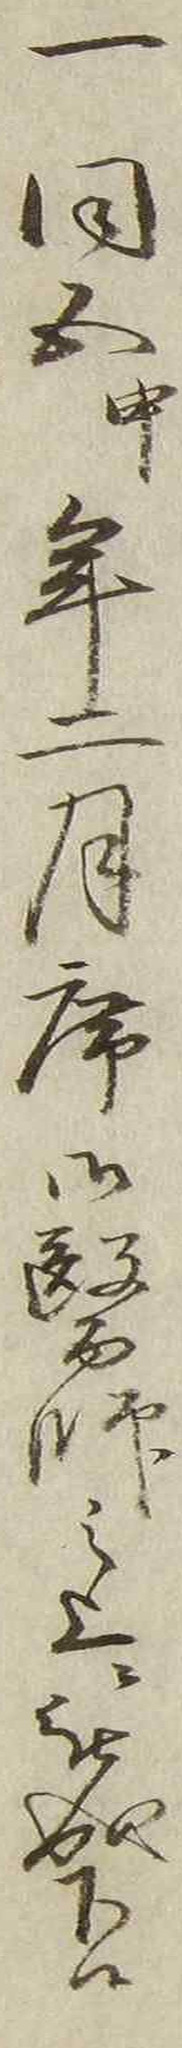一同五申年二月席御医師之上ニ被成下候

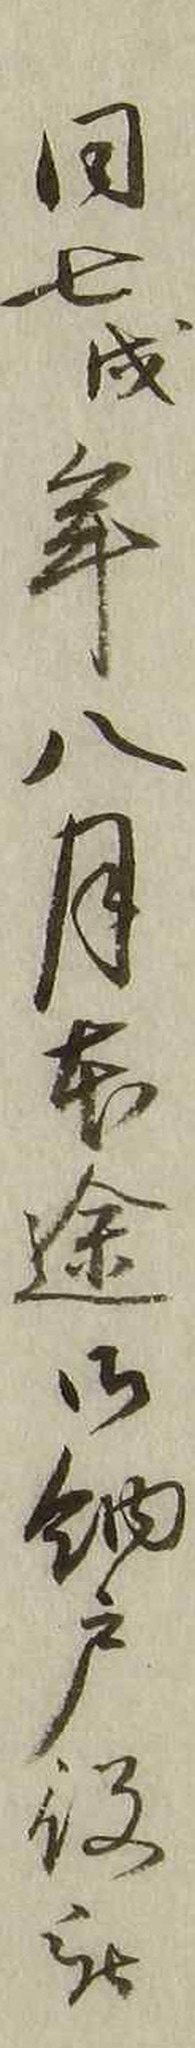一同七戌年八月本途御納戸役被
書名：諸士系譜　巻之114　か之部22
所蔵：会津若松市立会津図書館
